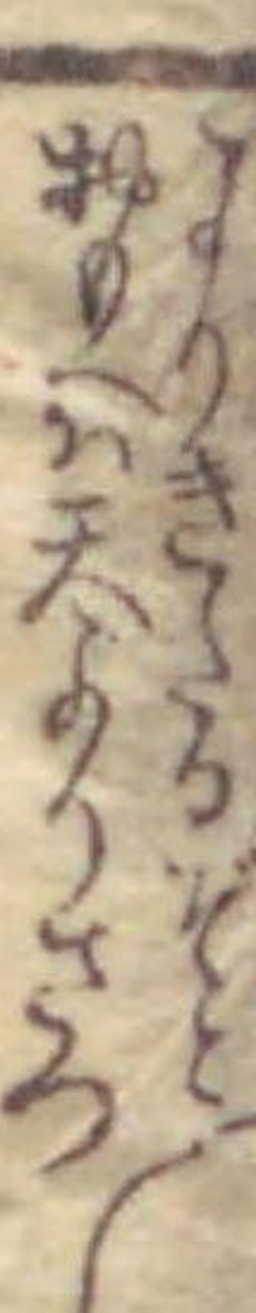おもへは天よりさつ
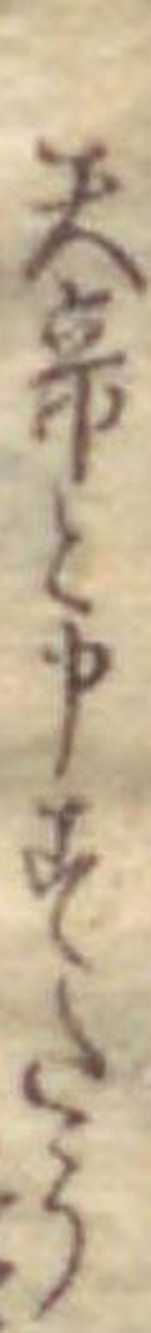天帝と申すたう
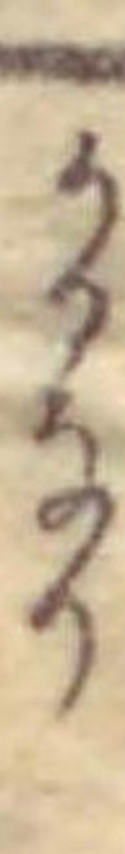かるなり
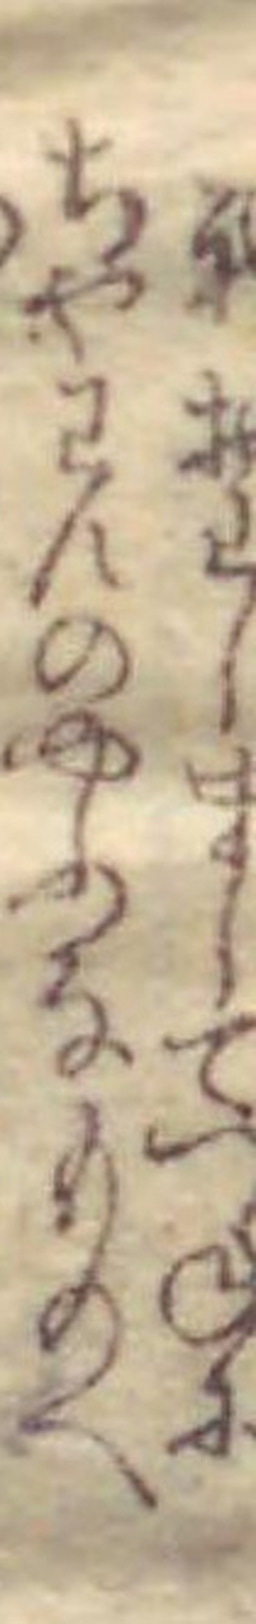ちやわんのやふなものへ
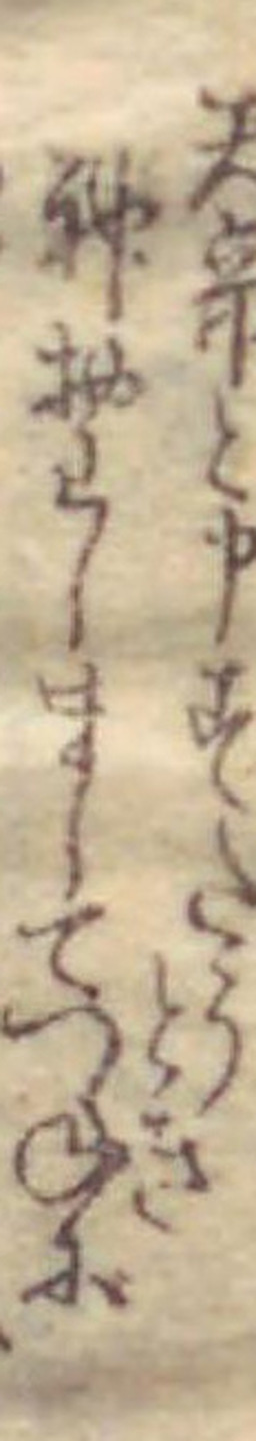神おわしましてつねに
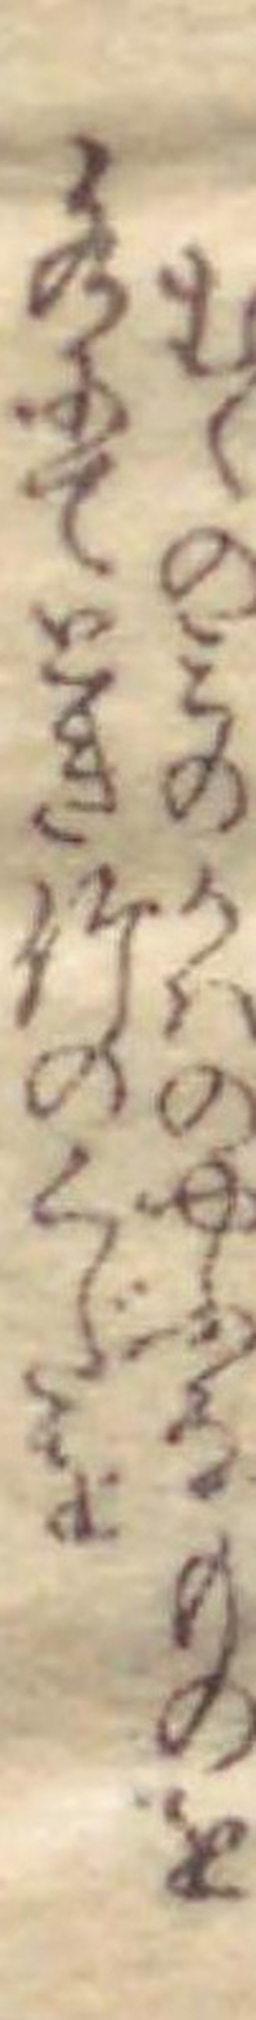水にてとき竹のくだを
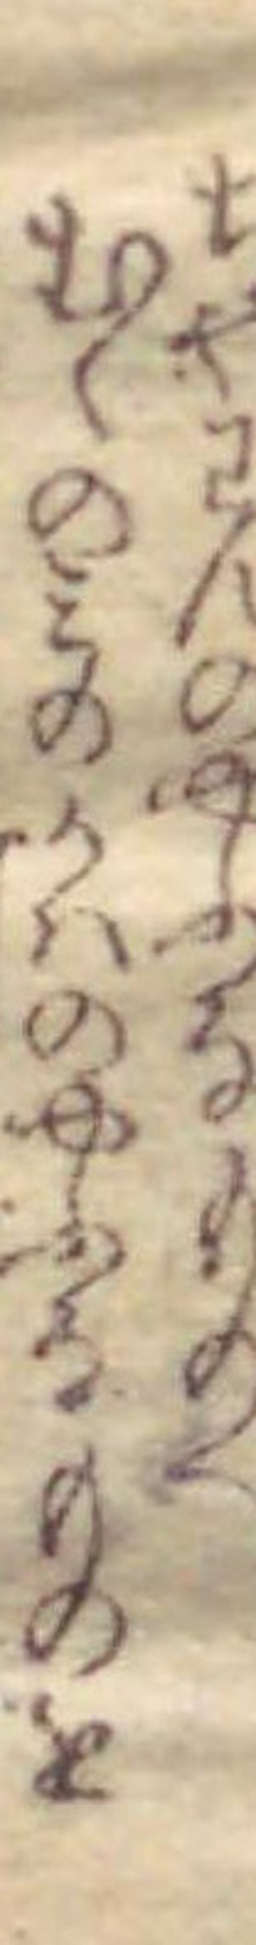むくのみのかはのやふなるものを
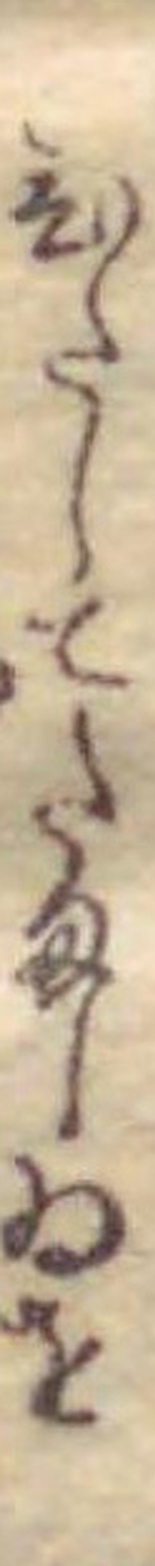ひたしてたましゐを
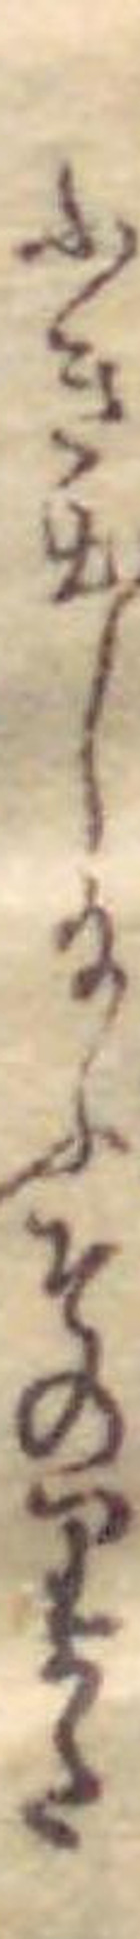ふき出し給ふそのりかた
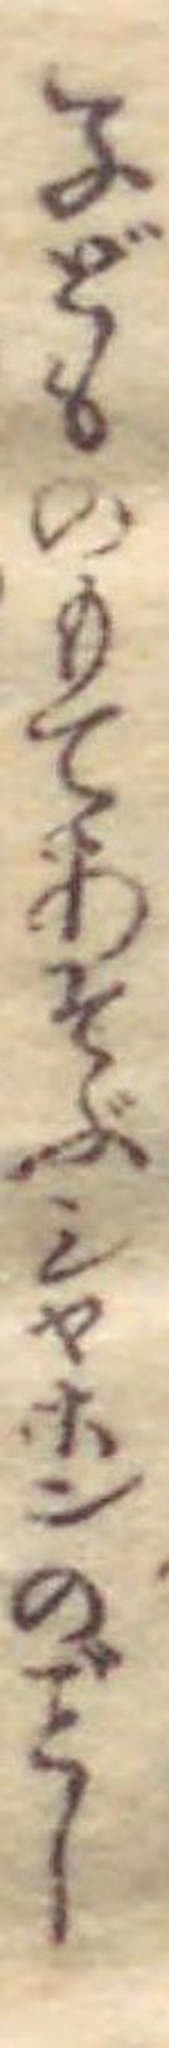子どものもてあそぶシヤホンのごとし
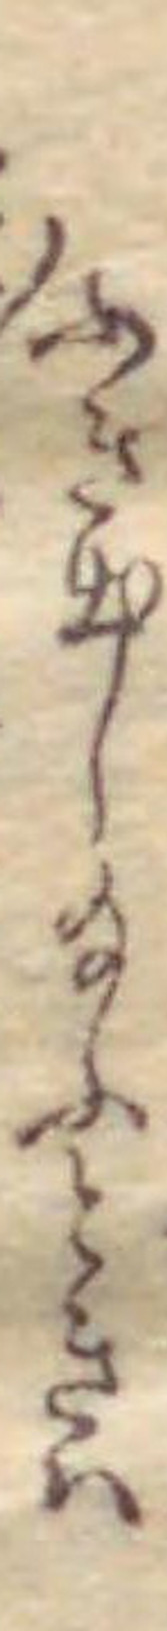ふき出し給ふときは
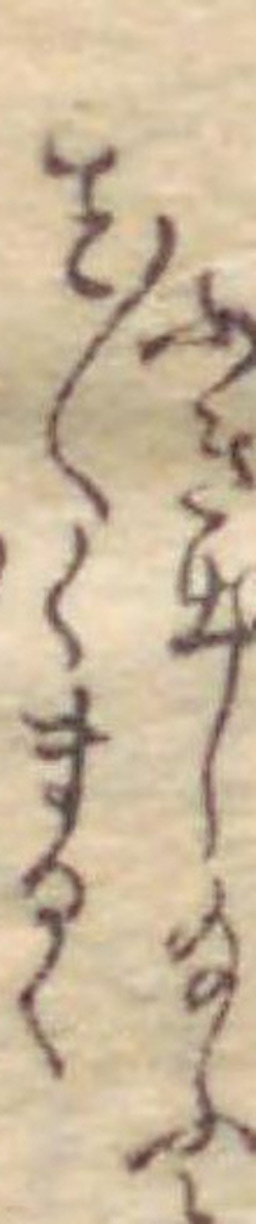こと〳〵くまるく
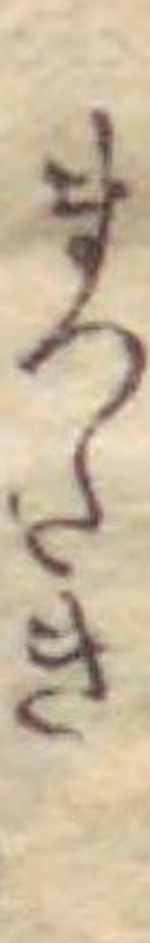まつたき
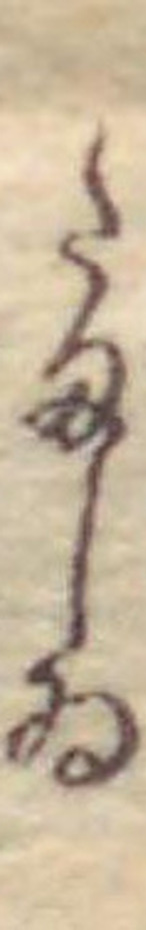たましゐ
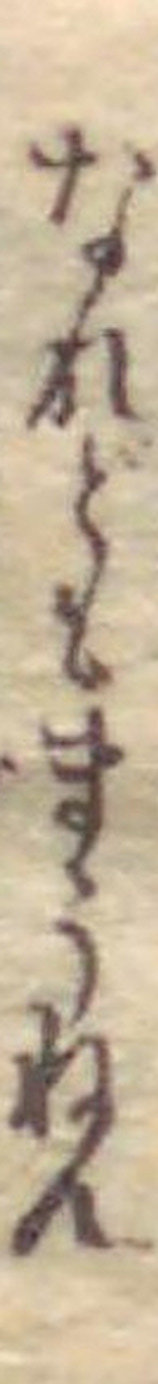なれどもまうねん
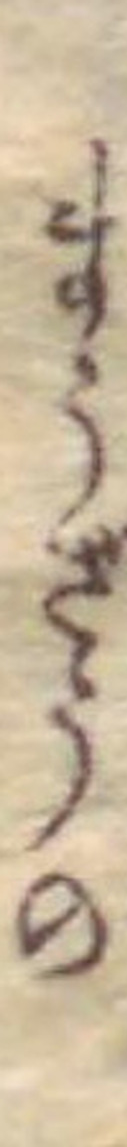まうざうの
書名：心学早染艸 : 3巻
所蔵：国立国会図書館 National Diet Library, JAPAN
